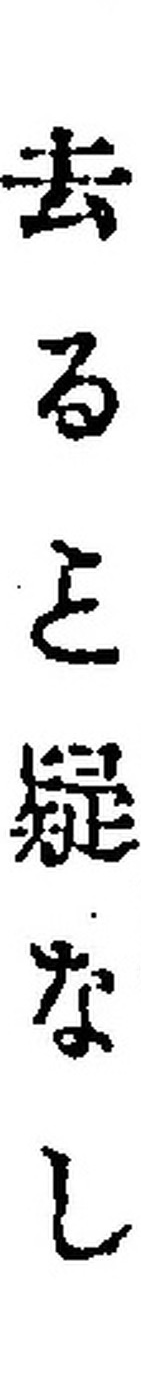去ること疑なし
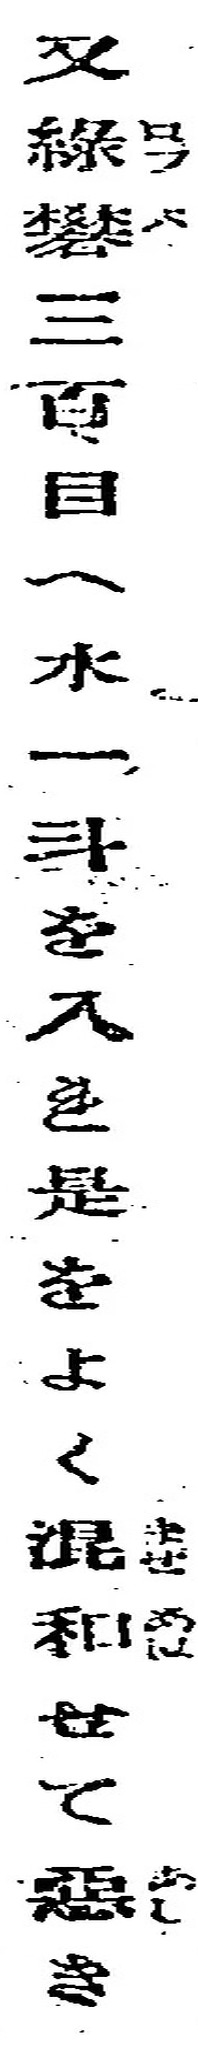又緑礬三百目へ水斗を入れ是をよく混和せて惡き
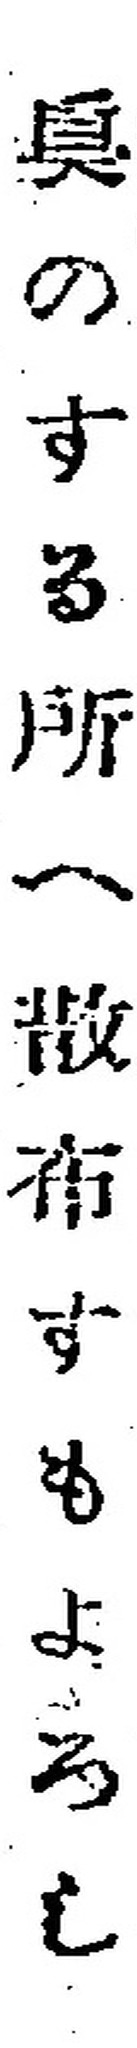臭のする所へ散布すもよろし
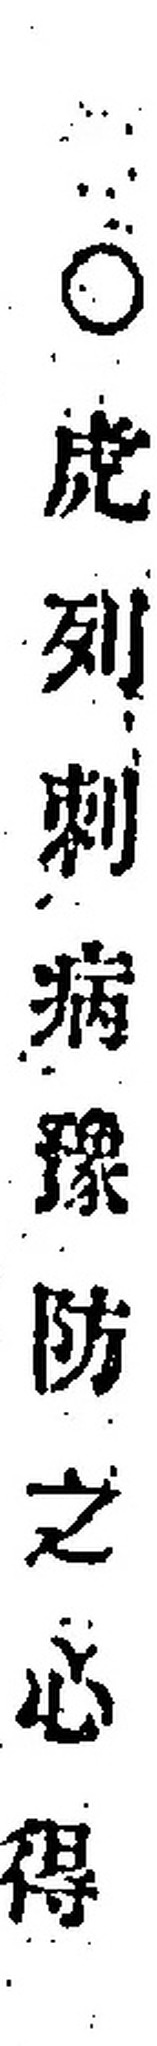〇虎列刺豫防之心得
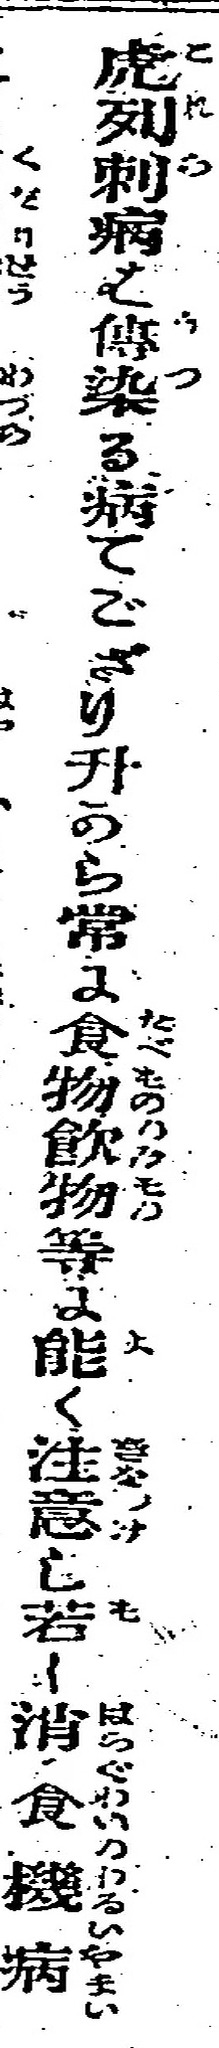虎列刺病は傳染る病てござり升から常に食物飲物等に能く注意しし消食機病
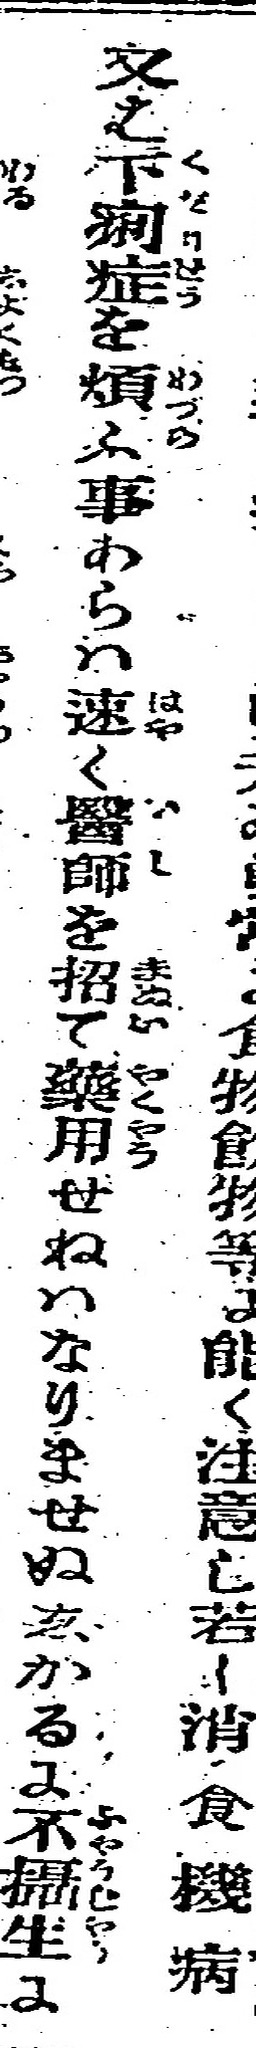又は下痢症を煩ふ事あらは速く醫師を招て藥用せねはなりませぬ然かるに不欇生に
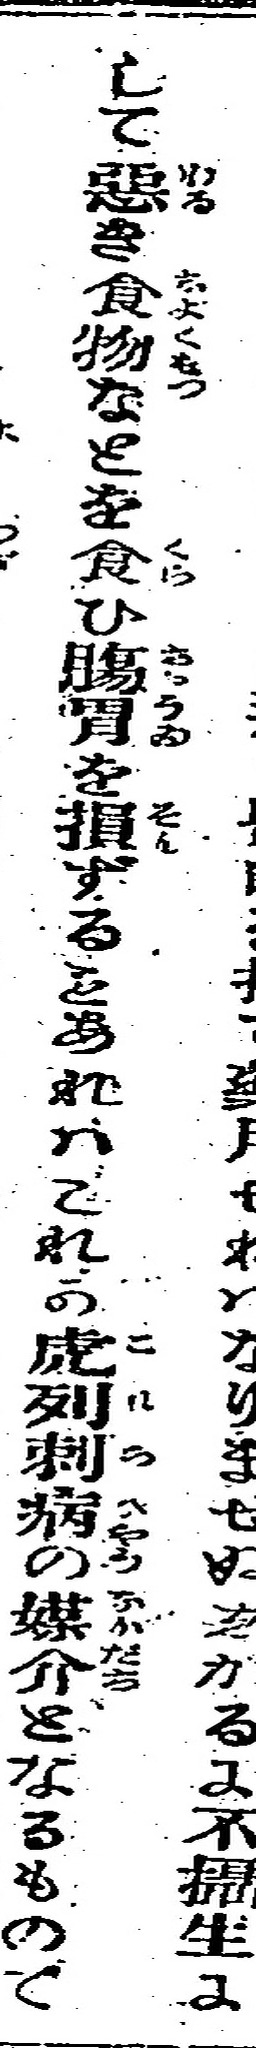して惡き食物などを食ひ膓胃を損ずることあれはこれの虎列刺病の媒介となるもので
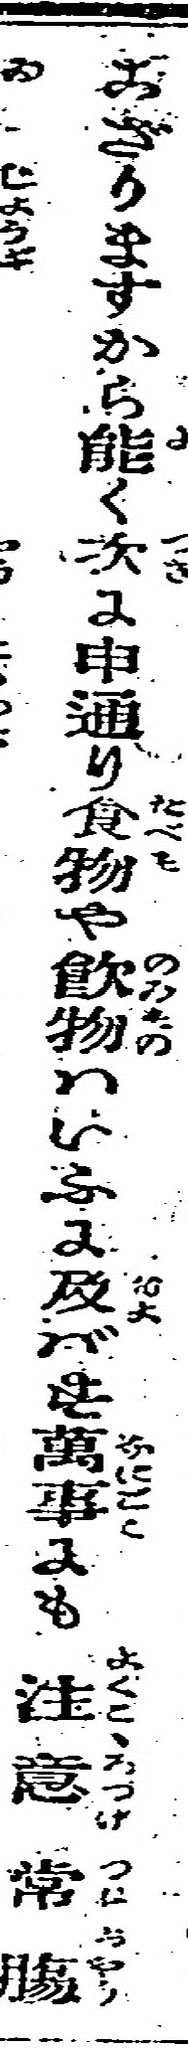ござりますから能く次に申通り食物や飲物はいふに及ばす萬事にも注意常膓
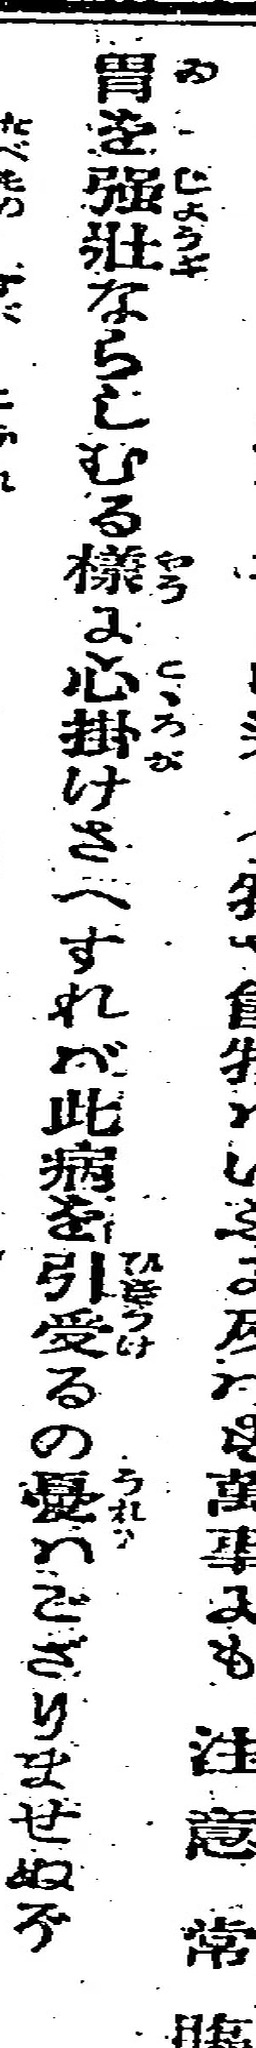胃を強壮ならしむる様に心掛けさひすれば此病を引受るの憂はござりませぬぞ
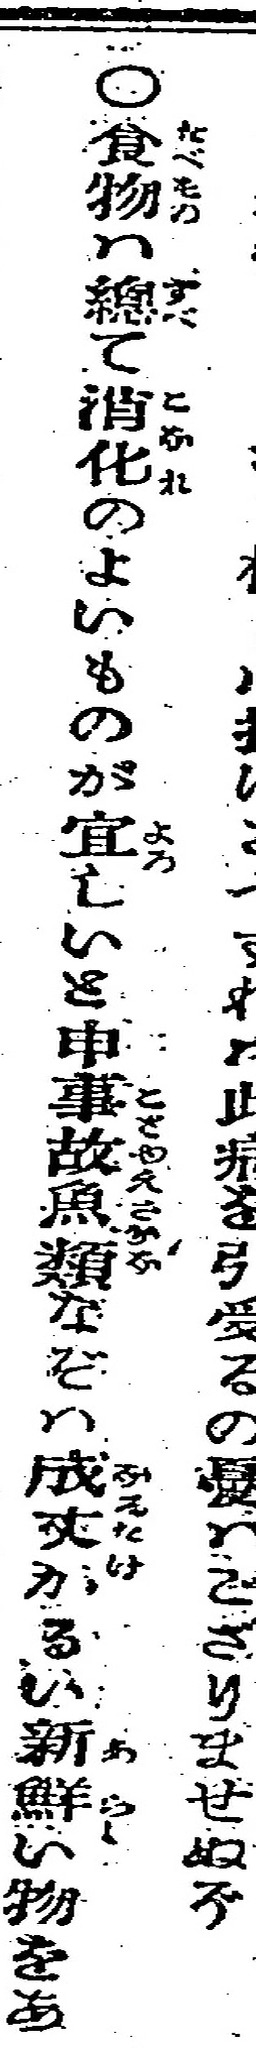〇食物は総て消化のよいものが宜しいと申故魚類などは成丈かるい新鮮い物をあ
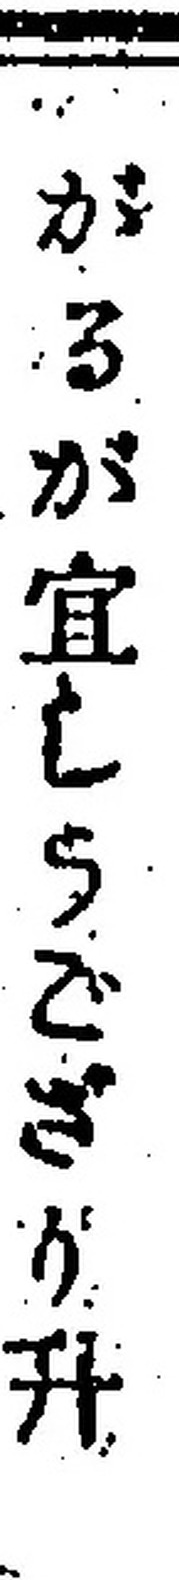がるが宜しうござり升
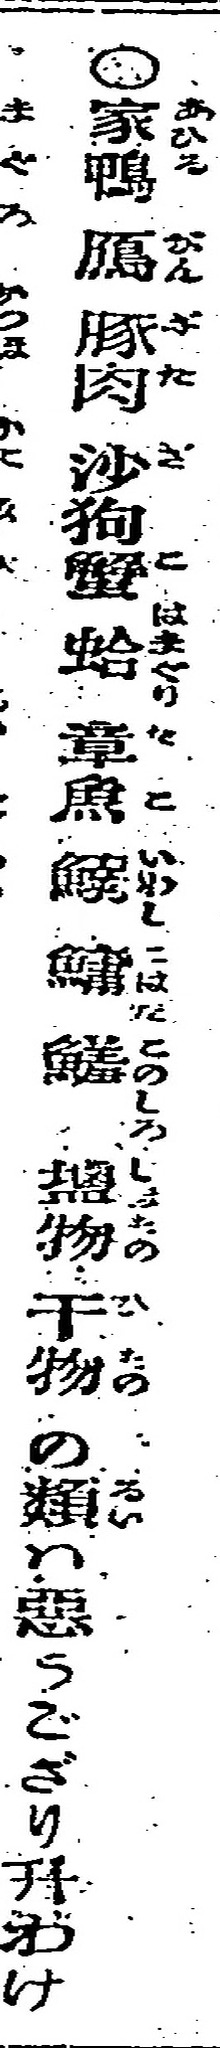〇家鴨鴈豚肉沙狗蟹蛤章魚鰯鱅鱃䀋物干物類は惡うござり升わけ
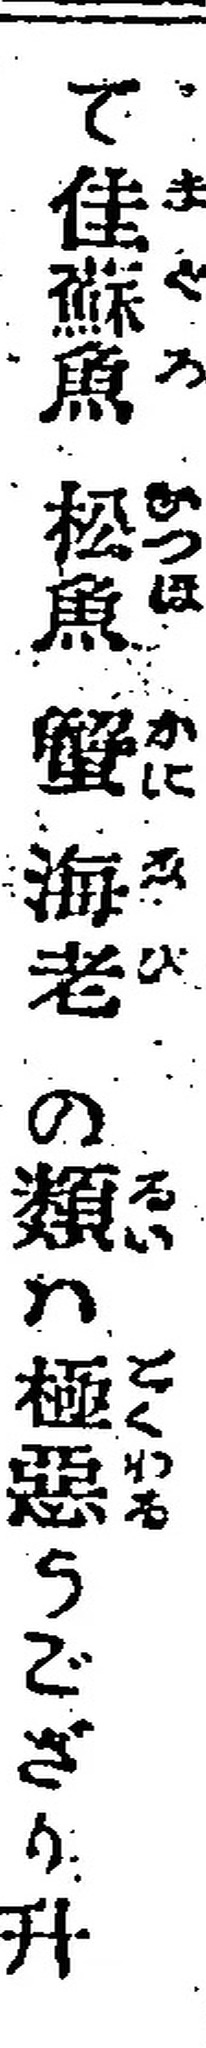て佳蘇魚松魚蟹海老の類は極惡うござり升
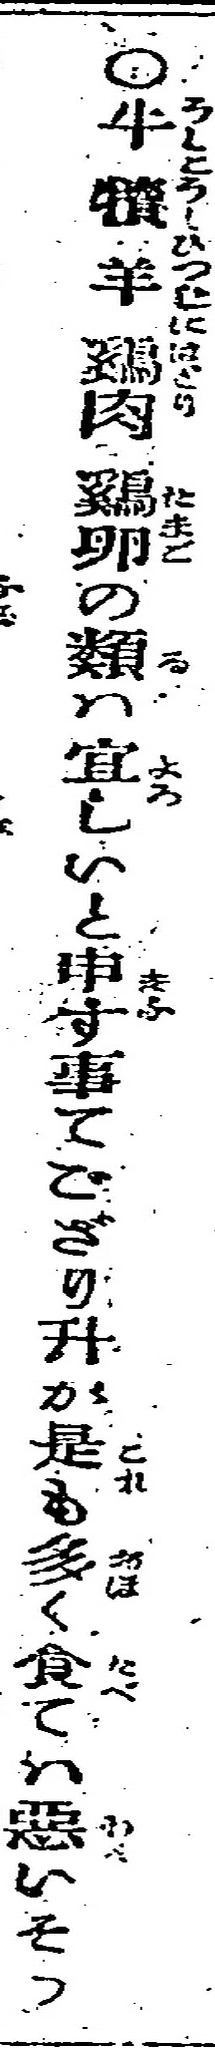〇牛犢羊鶏肉鶏卵の類は宜しいと申す事てござり升が是も多く食ては惡いそう
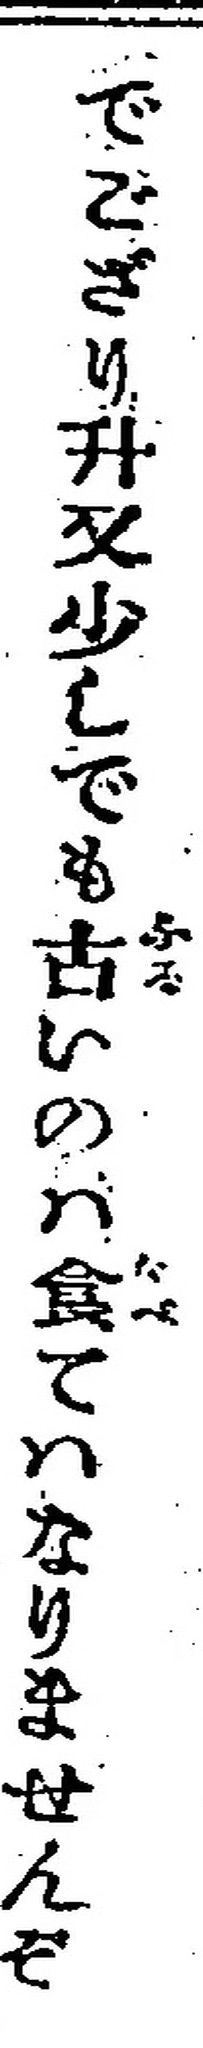でござり升又少しでも古いのは食べはなりませんぞ

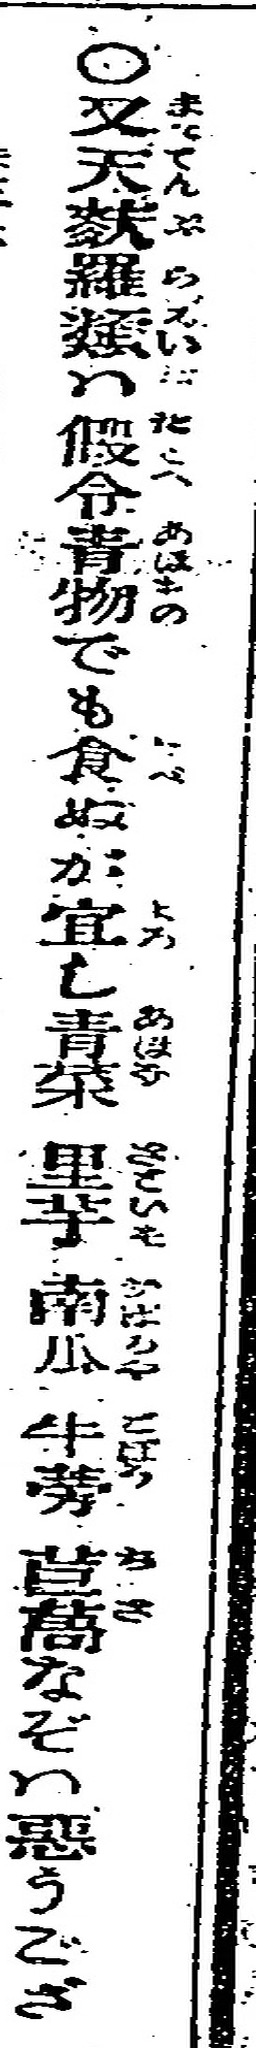〇又天麩羅類は假令青物でも食ぬが宜し青菜里芋南瓜牛蒡苣萵なぞは惡うござ
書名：虎列剌病予防の心得
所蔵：国立国会図書館 National Diet Library, JAPAN
